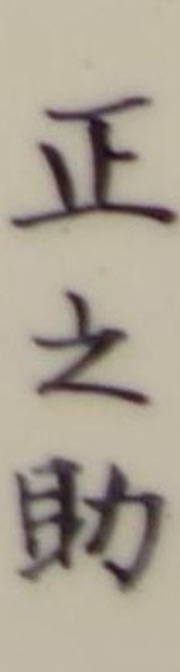正之助
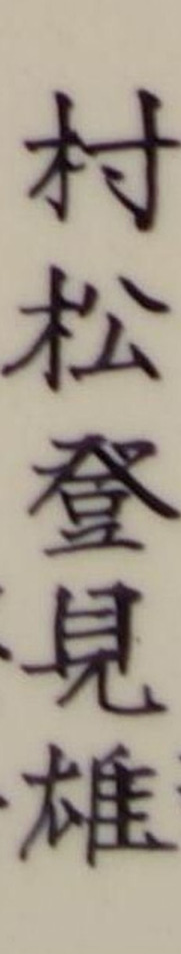村松登見雄
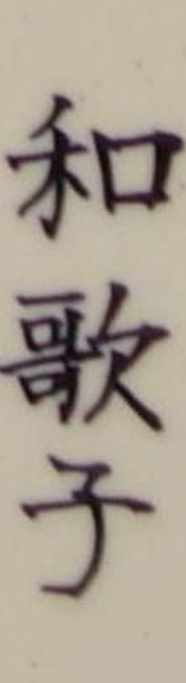和歌子
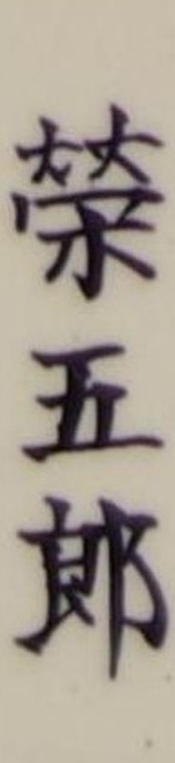榮五郎
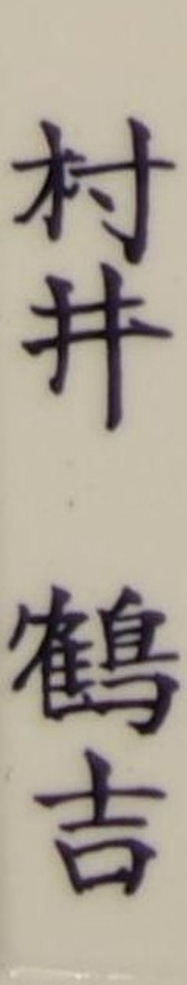村井鶴吉

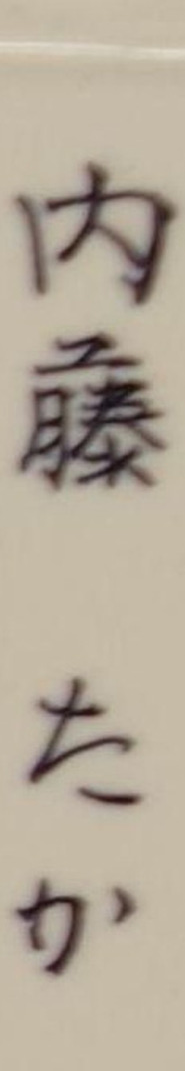内藤たか
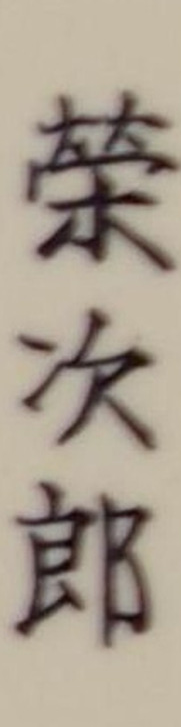榮次郎
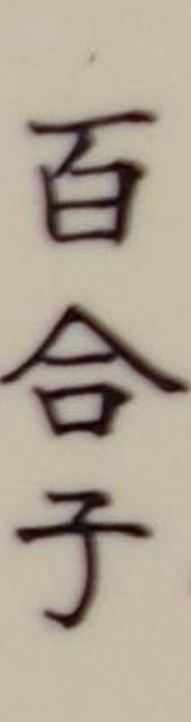百合子
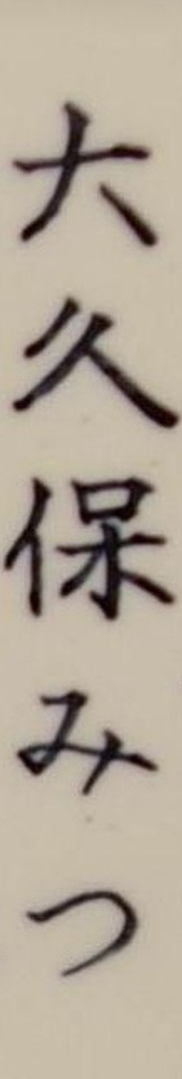大久保みつ
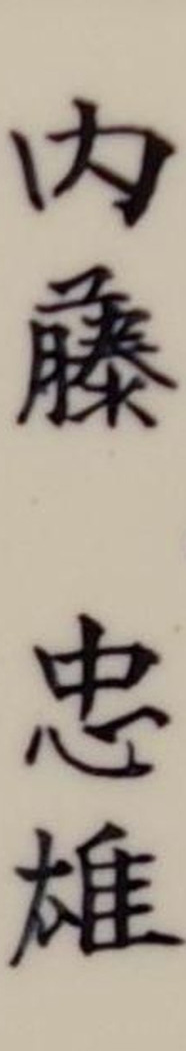内藤忠雄
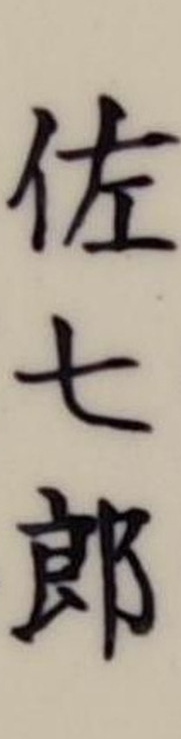佐七郎
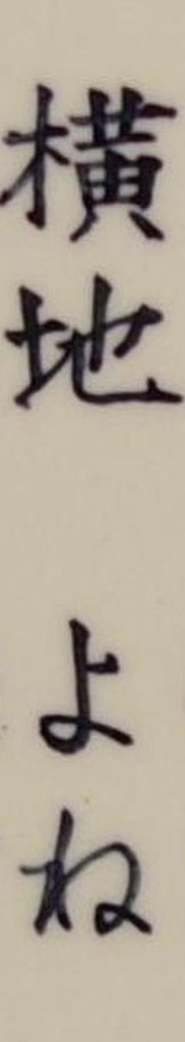横地よね
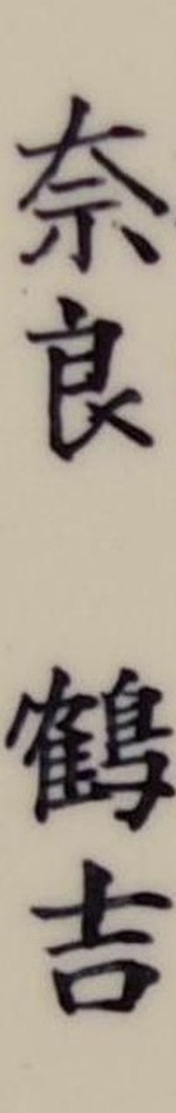奈良鶴吉
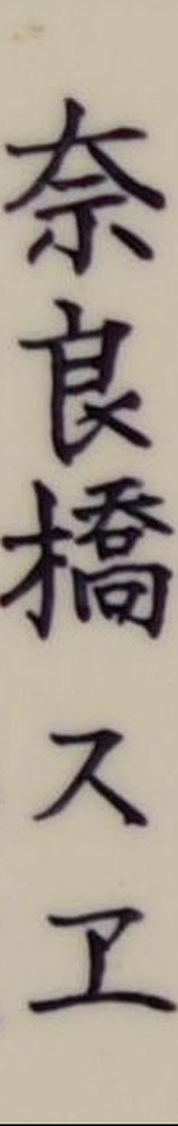奈良橋スエ
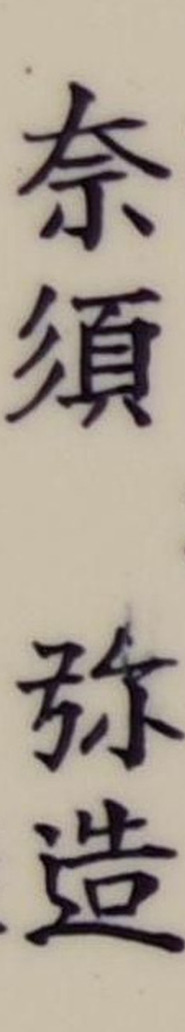奈須弥造
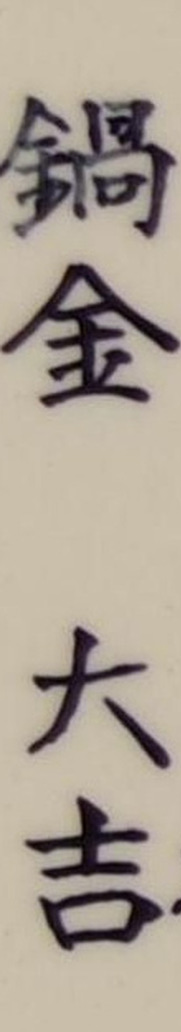鍋金大吉
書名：M~S
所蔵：高野山金剛峯寺
